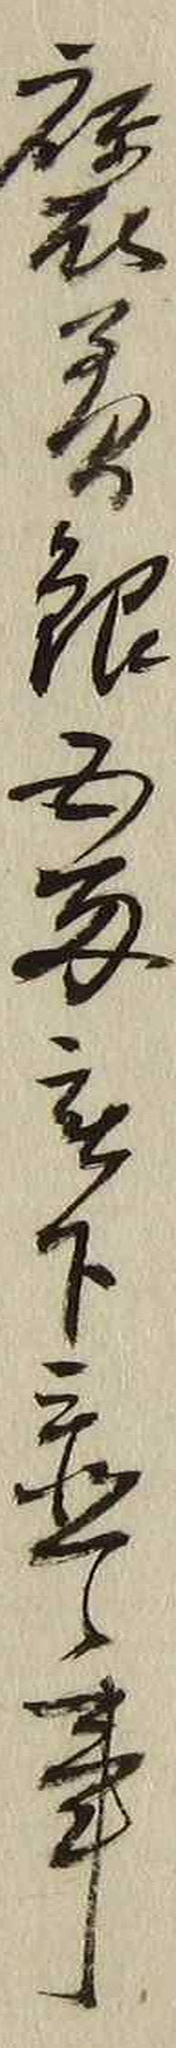褒美銀五両被下置候事
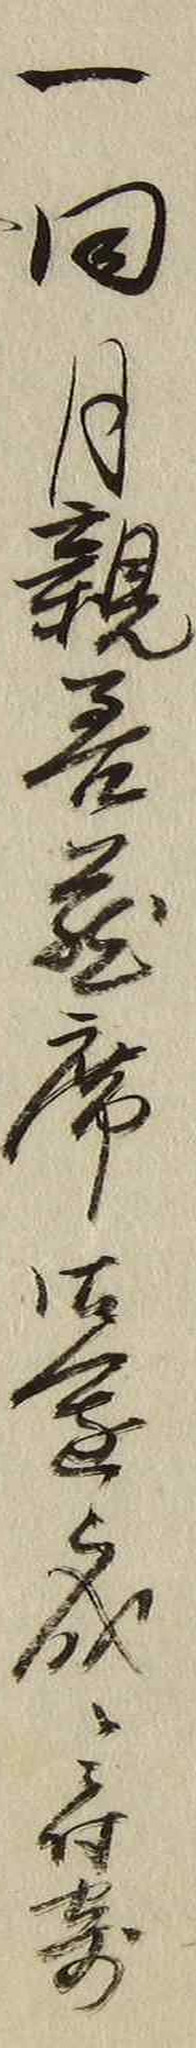一同月親善蔵席御還被成候ニ付寄
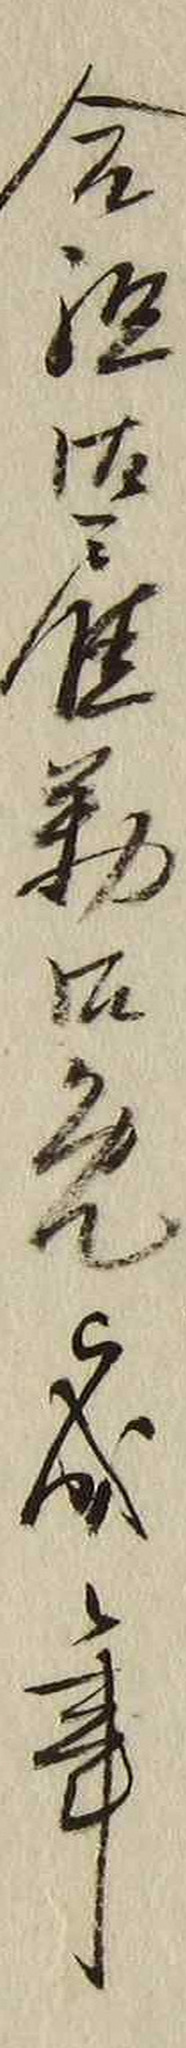合組御雇勤御免被成候事
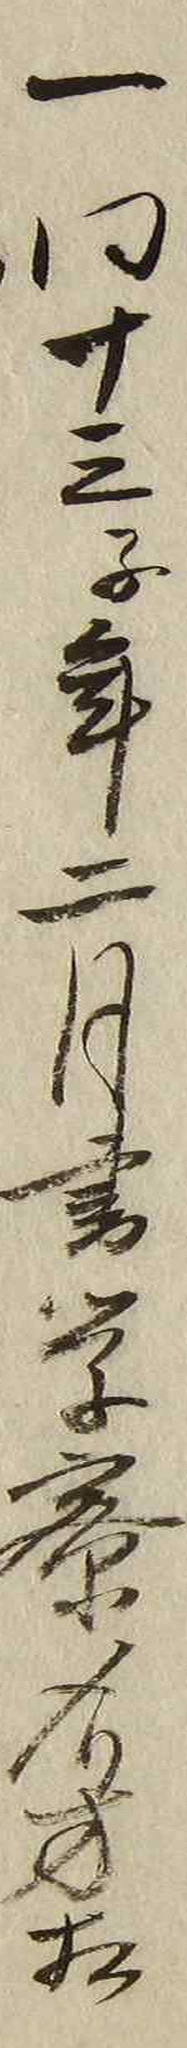一同十三子年二月書学寮〆り方相
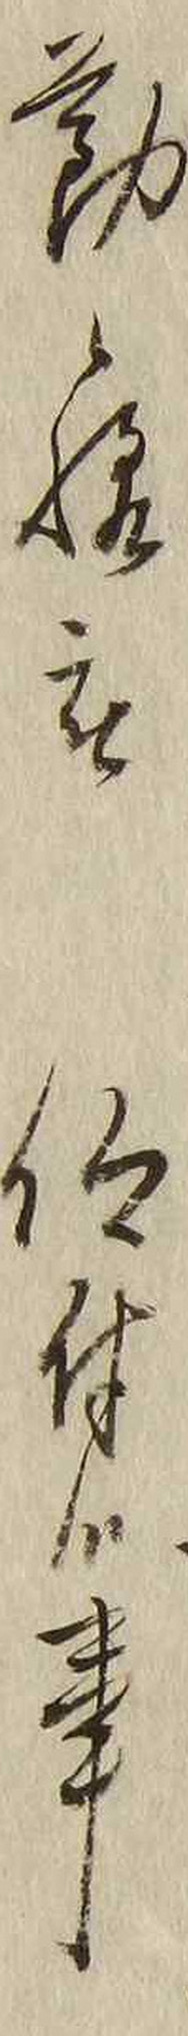勤候様被仰付候事

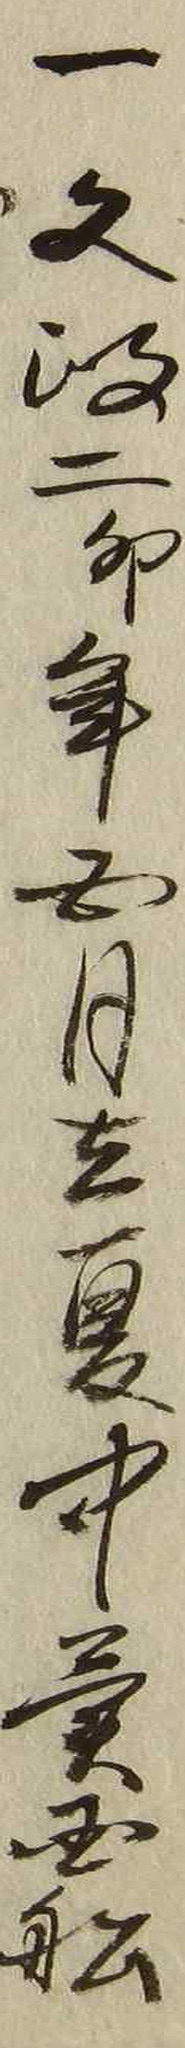一文政二卯年五月去夏中異国船
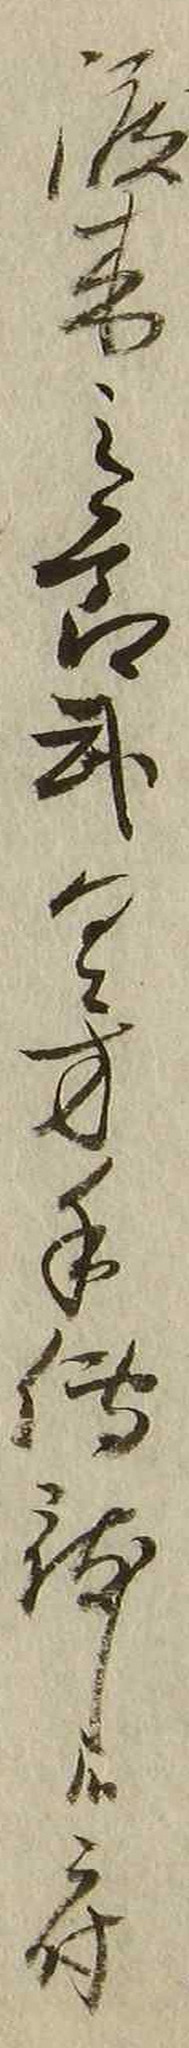渡来之節武具方手伝致候ニ付
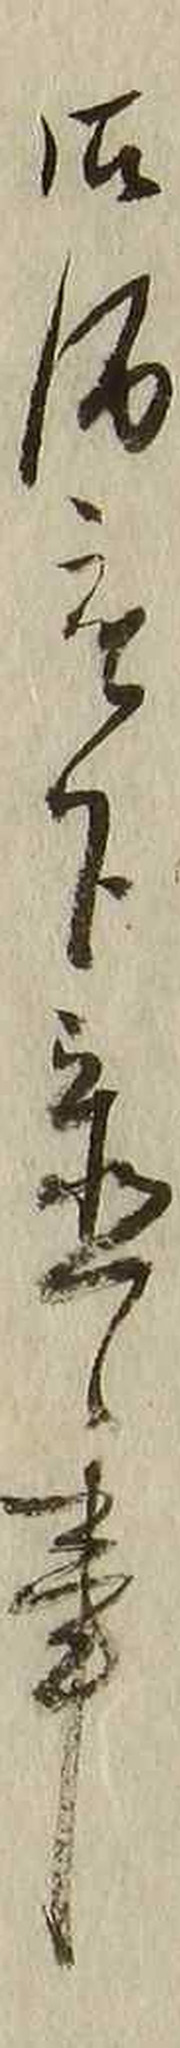御酒被下置候事
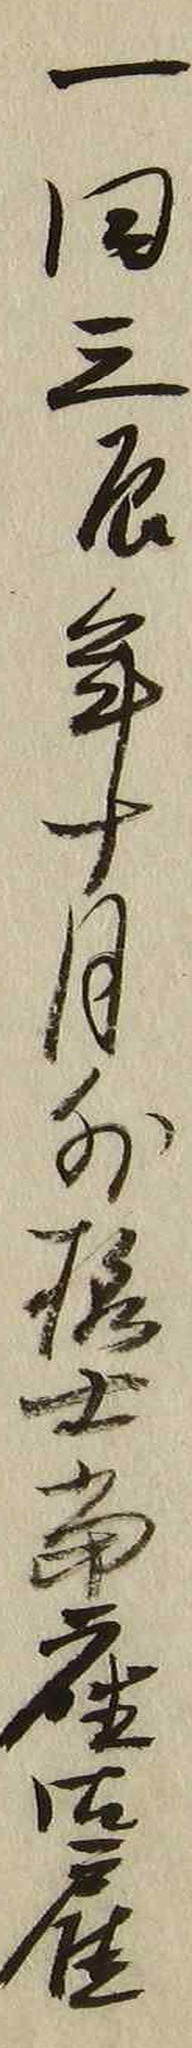一同三辰年十月外様士当座御雇
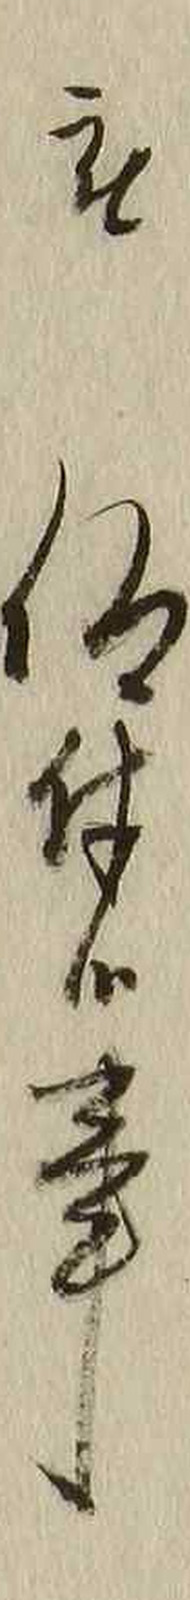被仰付候事
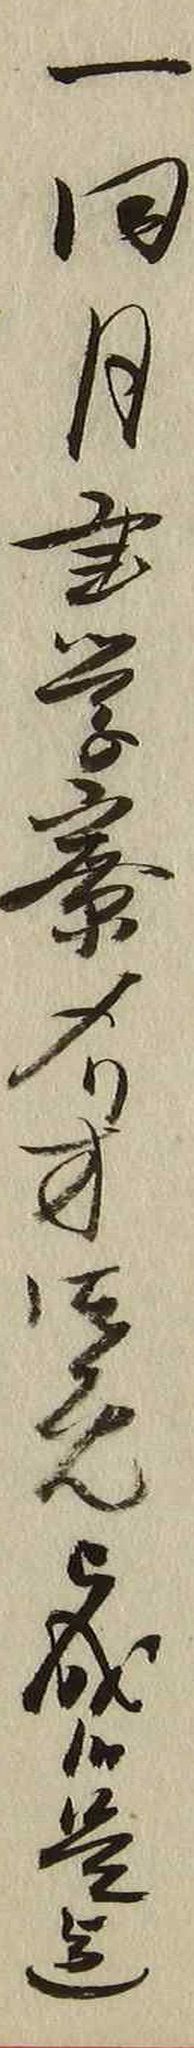一同月書学寮〆り方御免被成候是迄
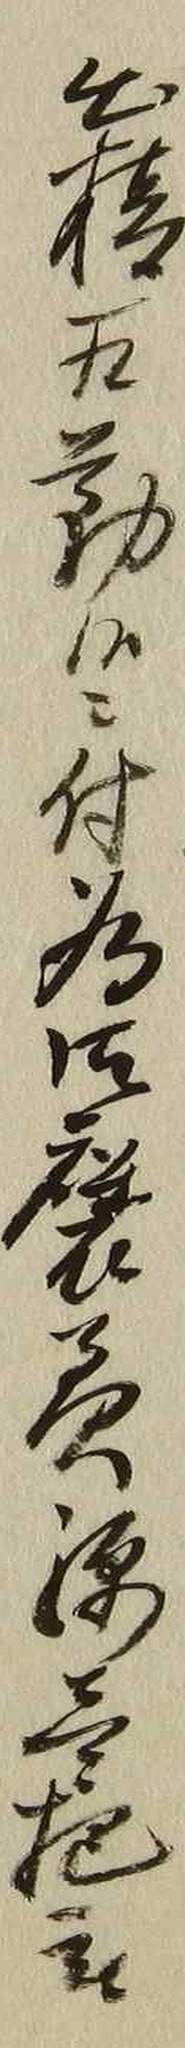出精相勤候ニ付為御褒美綿壱把被
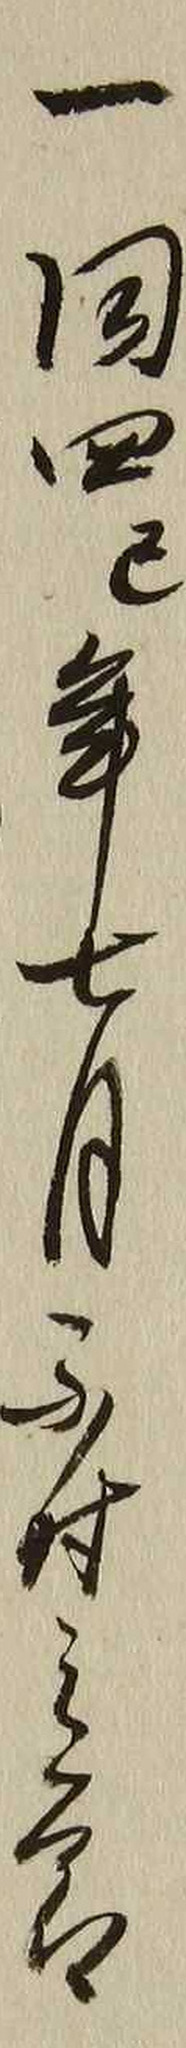一同四巳年七月不時之節
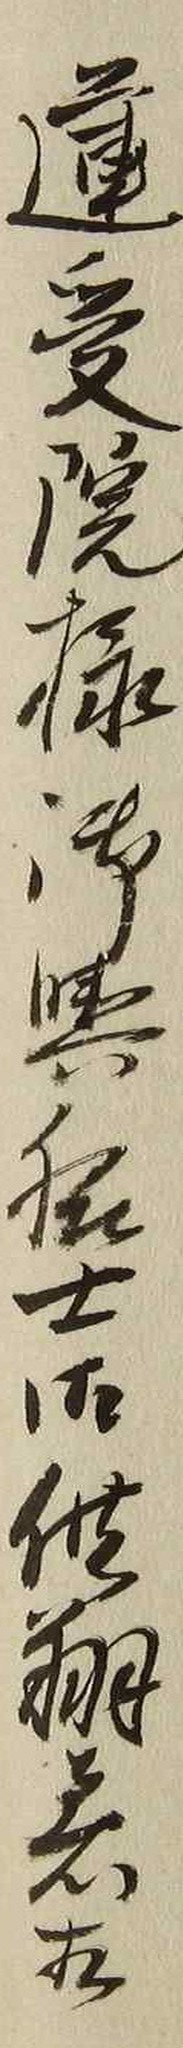蓮受院様御輿脇士御供翔着相
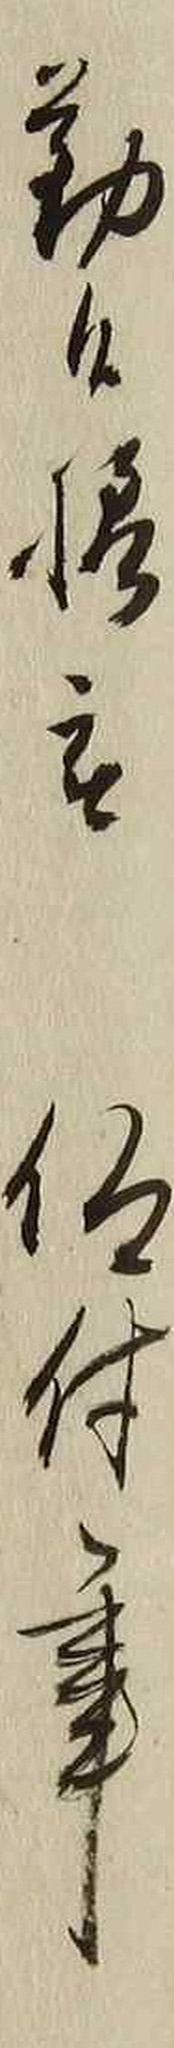勤候様被仰付候事
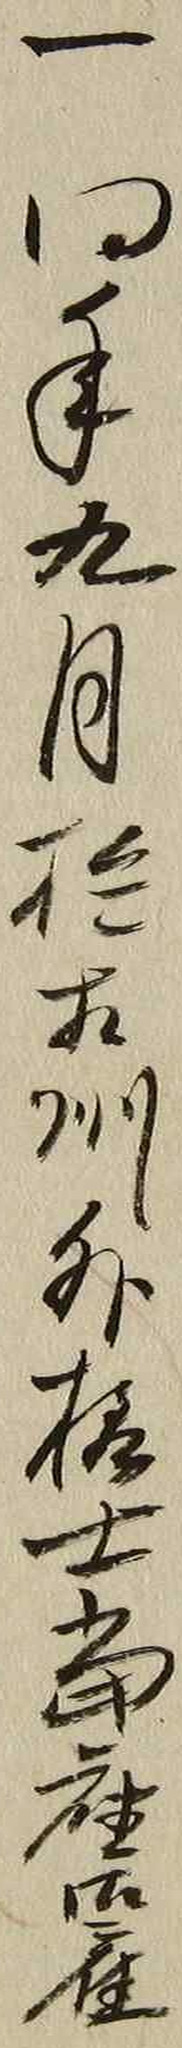一同年九月於相州外様士当座御雇
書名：諸士系譜　巻之352　す之部2
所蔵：会津若松市立会津図書館
